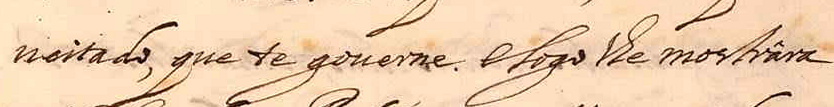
ueitado, que te gouerne. E logo lhe mostrâra
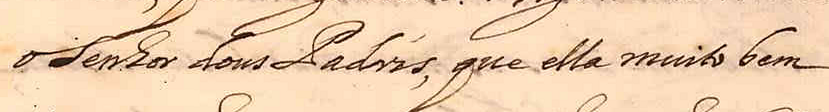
o Senhor dous Padres, que ella muito bem
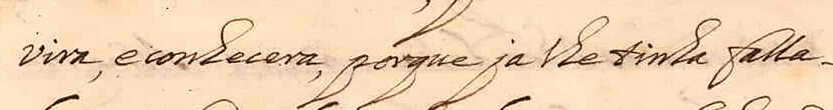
vira, e conhecera, porque ja lhe tinha falla
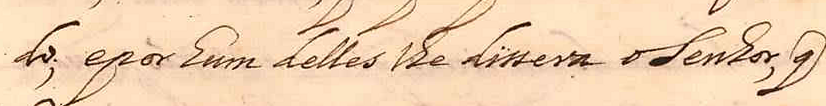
do; e por hum delles lhe dissera o Senhor, q̄
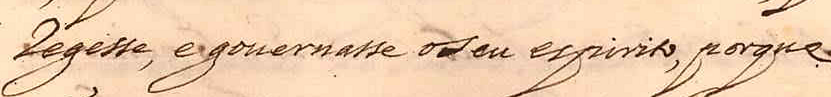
Regesse, e gouernasse o seu espirito, porque
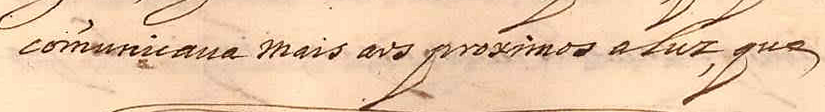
com̄unicaua mais aos proximos a Luz, que
